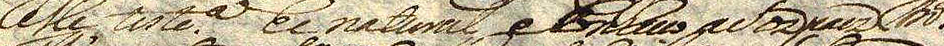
elle, teste.a he natural, e Concluio peloz paez An.to
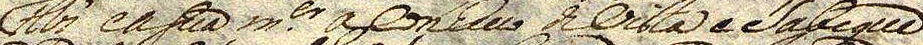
Alz̄ e a sua m.er a Conheceo de Vista e sabe que
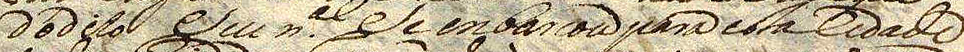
do dito seu n.al se enbarcou para esta Cidade
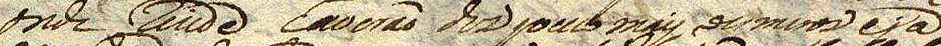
onde Rezide heveraõ dez pouco mais, ou menos e ja
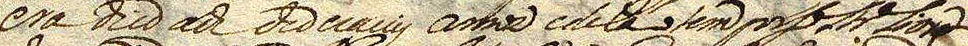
era de idade de dezaceis annoz e dela o tem por sltr.o Livre
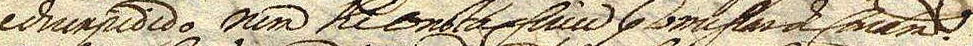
e dezempedido nem lhe consta fizeçe promessas de Cazam.to
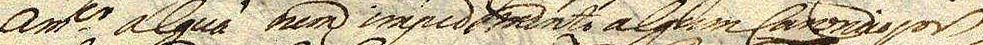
a m.er alguā nem impedimento algum Cannonico por
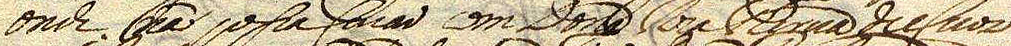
onde naõ possa Cazar com Dona Roza Thereza de Iesuz
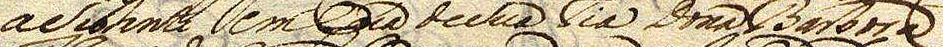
asistente em a caza de sua Tia Dona Barbosa
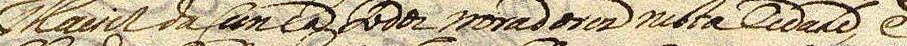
Maciel da Cunha todos moradorez nesta Cidade, e
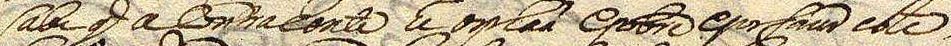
sabe q̄ a Contrahente he orphaã e pobre e por fazer este
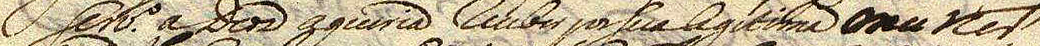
serv.o a Deoz a queria Receber por sua legitima mulher,
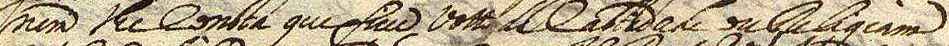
nem lhe Consta que fizece votto de Castidade ou Religiam
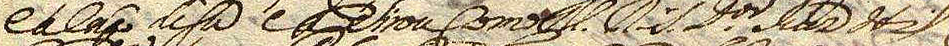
e al naõ disse e asinou Com o M. R rS. D.or Iuiz doz
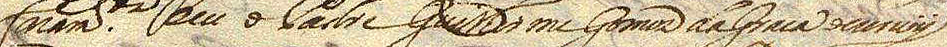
Cazam.toz e eu o Padre Guilherme Gomez da Graça o escrevy
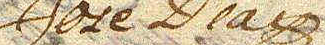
Joze Dias
